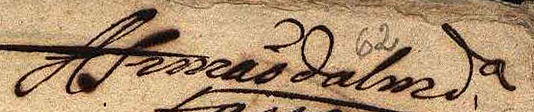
A simaõ daImd.a
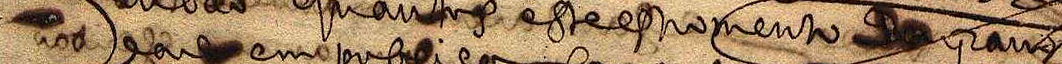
Saibaõ quantos este estromento dagrauo
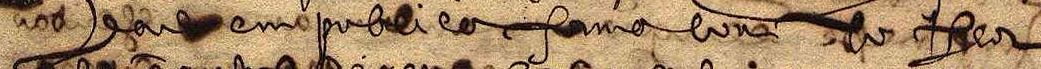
Dado em publica forma com ho theor
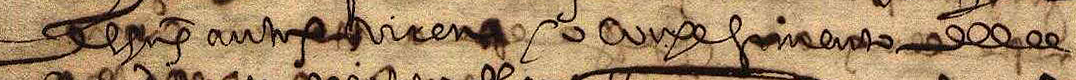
de hūs autos virem e o conhesimento delle
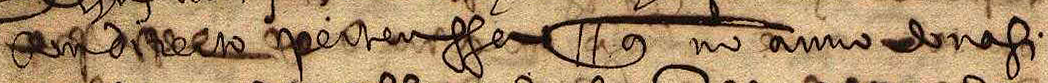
com direito pertenssa // q̄ no anno do nasi
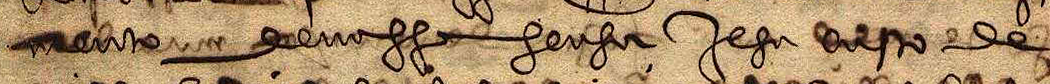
mento de nosso senhor Jesu cristo de
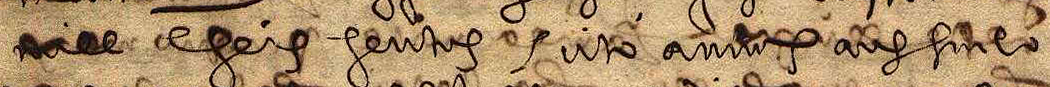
mill e seissentos e oito annos aos sinco
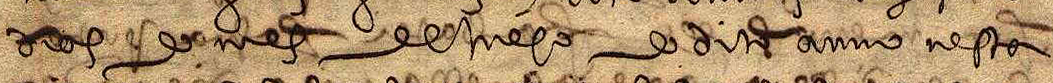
dias do mes de Iulho do dito anno nesta
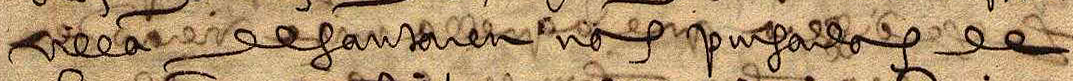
villa de santarem nas pousadas de
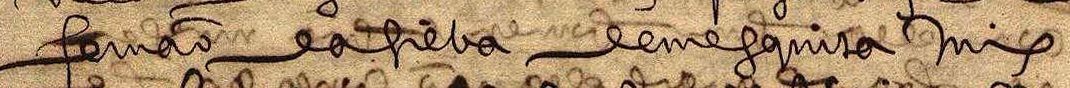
fernaõ da silva de mesquita Iuis
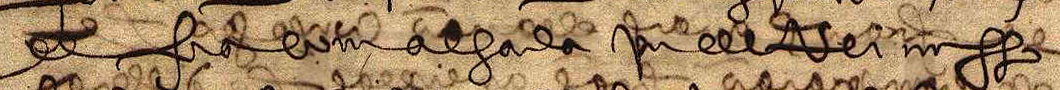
de fora com alsada por ell Rei nosso
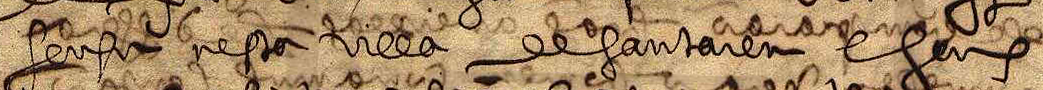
senhor nesta villa de santarem e seus
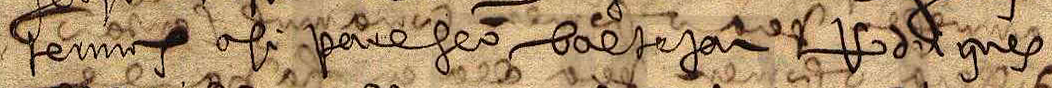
termos ahi pareseo baltesar Rodrigues
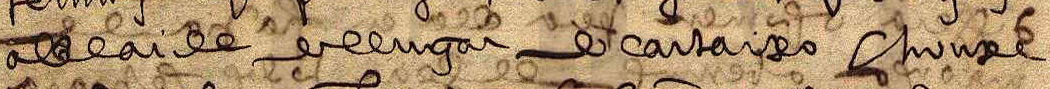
allcaide do llugar do cartaixo E trouxe
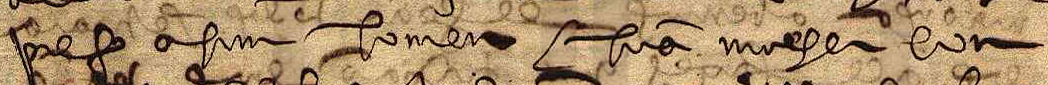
preso a hum homem E huā molher com
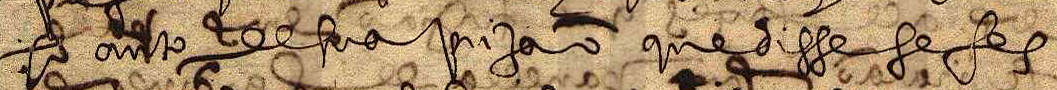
ho auto de sua prizaõ que disse se fes
